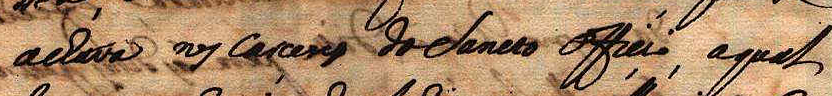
achava nos carceres do Sancto Officio, a qual
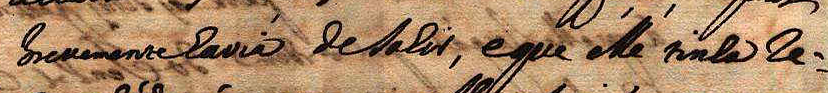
brevemente havia de sahir, e que elle tinha Re
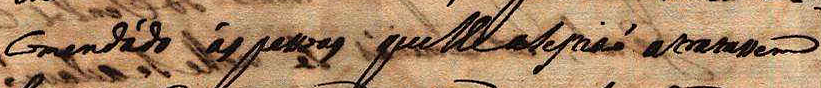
Comendado ás pessoas que lhe asestiaõ a tratassem
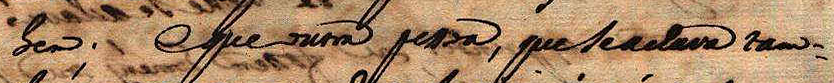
bem; e que outra pessoa, que se achava tam
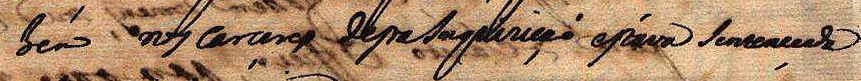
bem nos carceres desta Inquiziçaõ estava sentenceada
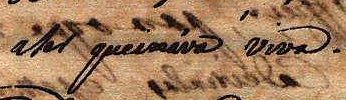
a ser queimava viva.
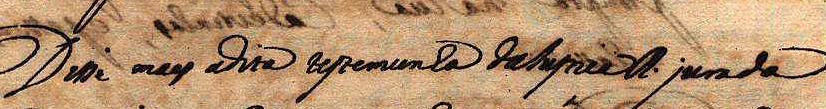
Disse maes a dita testemunha da Iustiça A. jurada
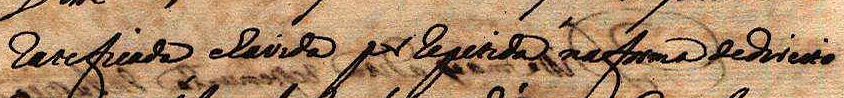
Rateficada, e havida por Repetida na forma de direito
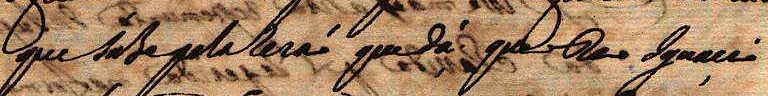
que sabe pela Rezaõ que dá que o Reo Ignacio
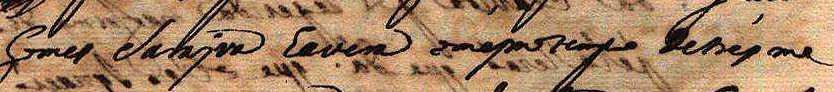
Gomes Sarajva havera o mesmo tempo de tres me
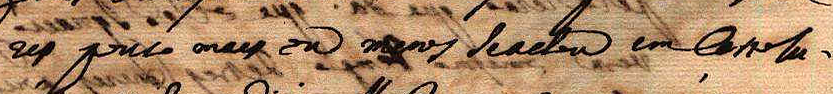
zes pouco mais ou menos se achou em Certo lu
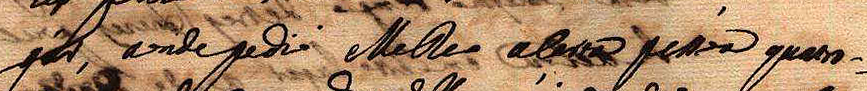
gar, aonde pedio elle Reo a Certa pessoa quatro
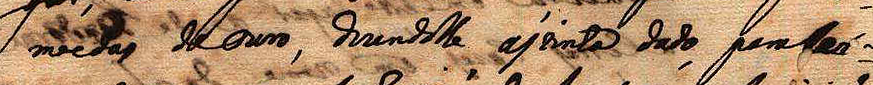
moedas de ouro, dizendolhe as tinha dado, para Cer
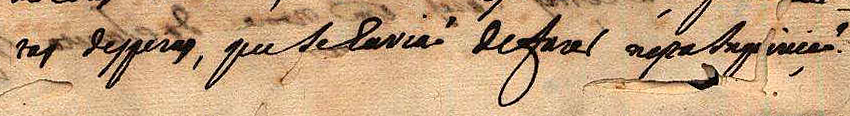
tas despezas, que se havia de fazer nesta Inq_iziçaõ.
